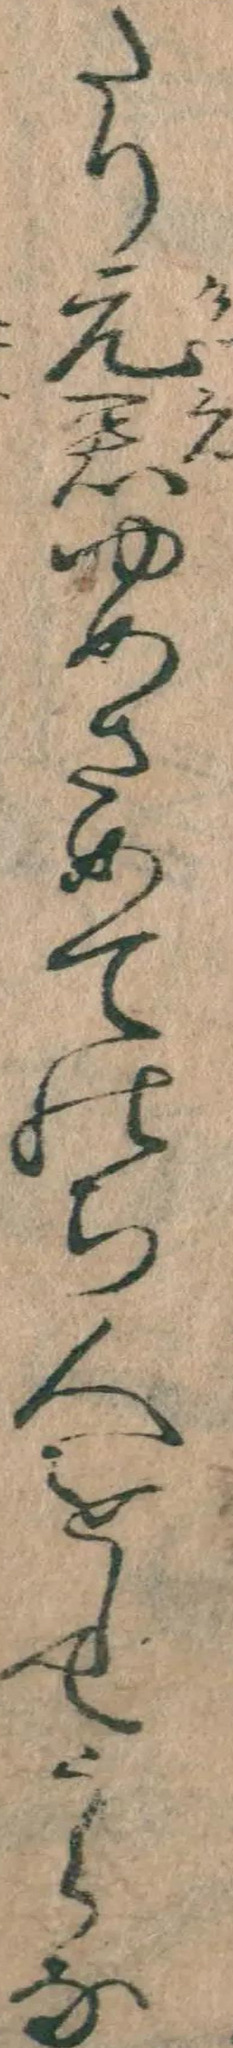たり元君ゆめさめてのち人をしてうらな
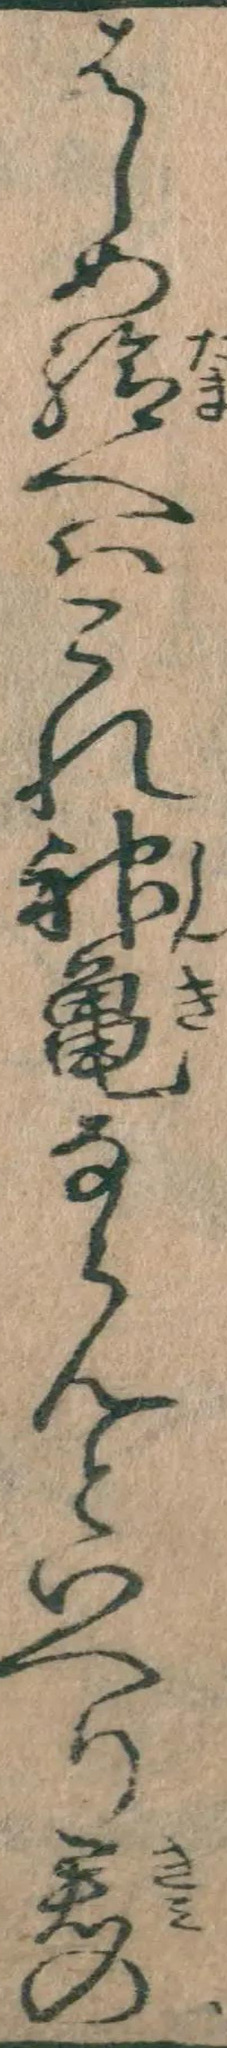はしめ給へはこれ神亀ならんといへり君の
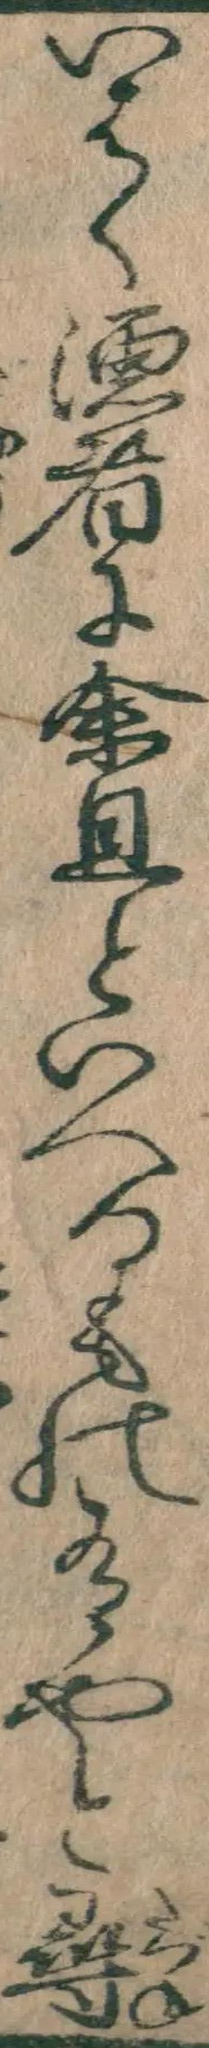いはく漁者に余旦といへるもの有やと尋
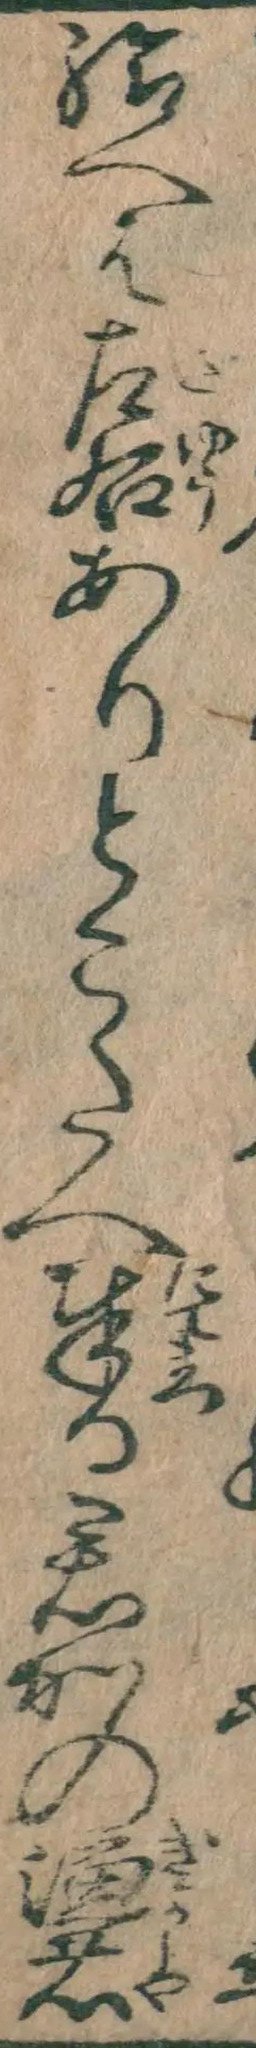給へは左右ありとこたへ奉る君かの漁者

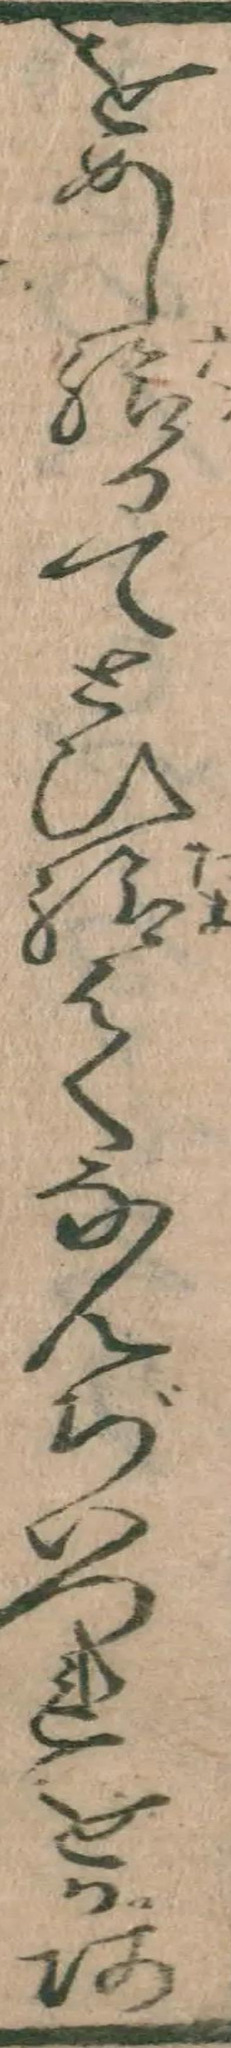をめし給ひてとひ給はくなんぢいつれをか。あ
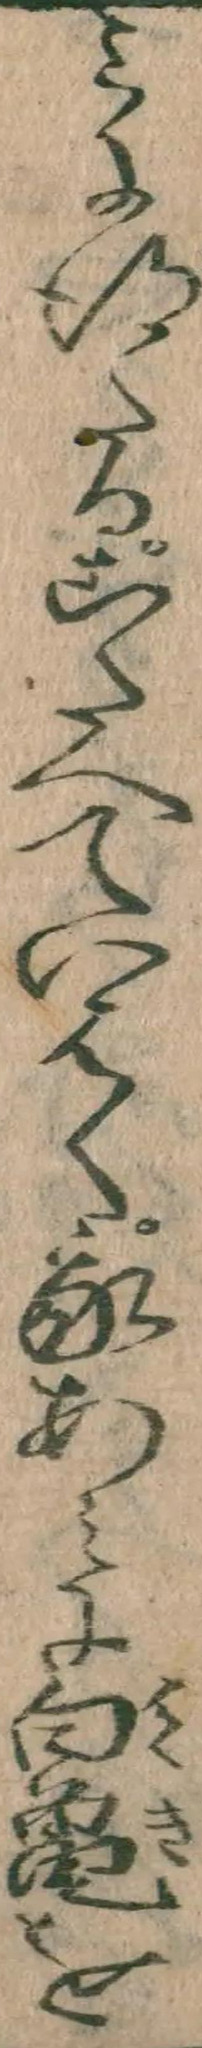みに得たる。こたへていはく。我あみに白亀を
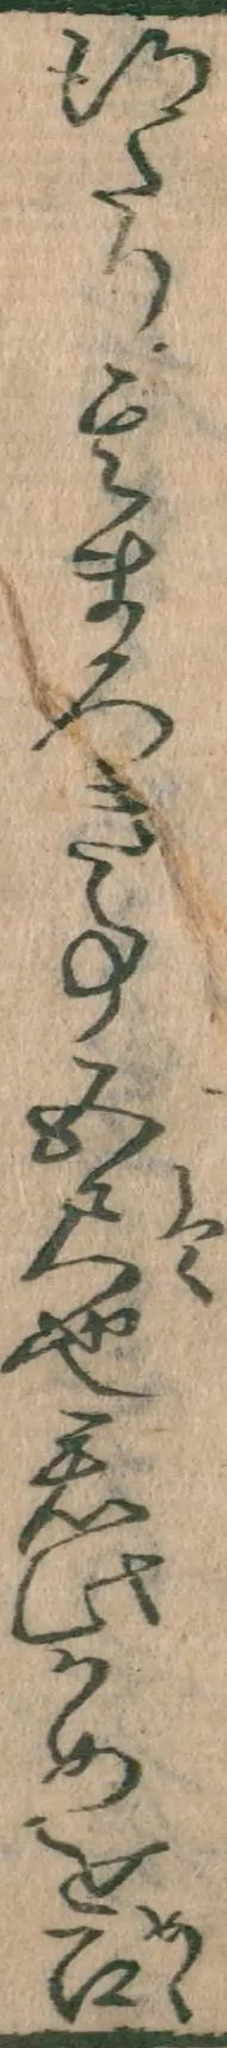得たり、其まろき事五尺也君此かめを召
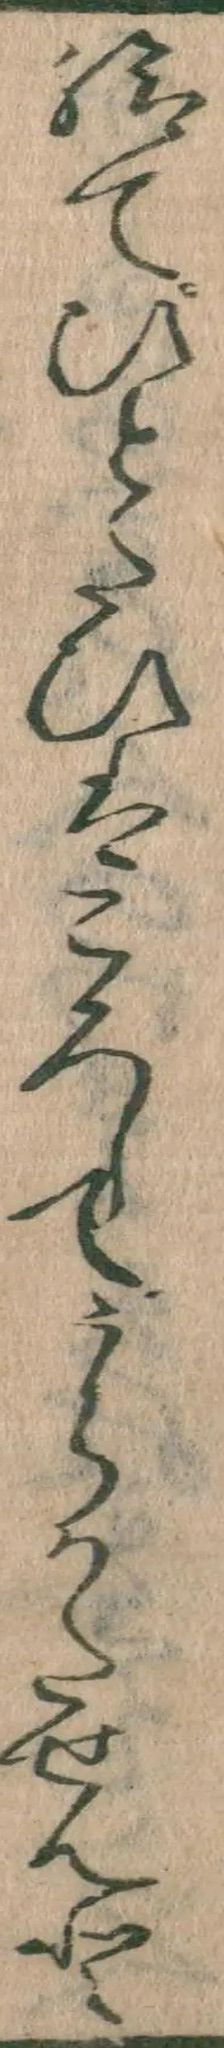給て。ひとたひはころしてうらかたせんと
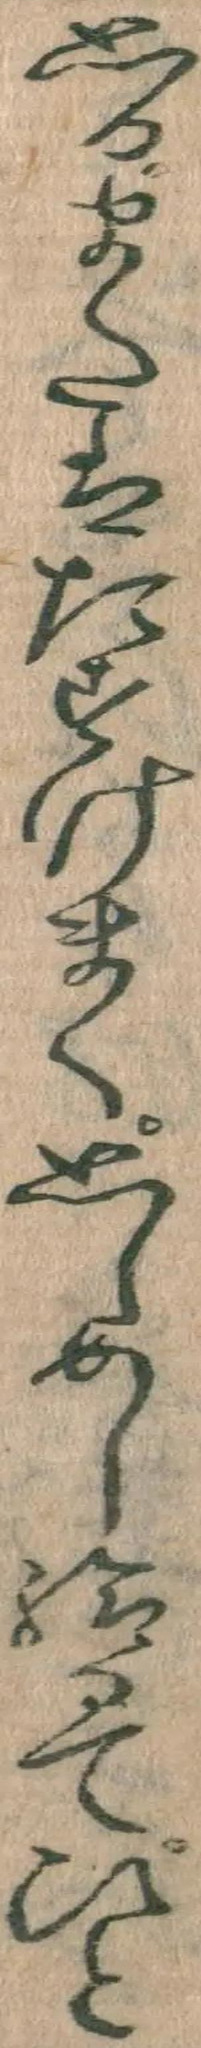思ひ。またはたすけまく。思しめし給ひて。ひと
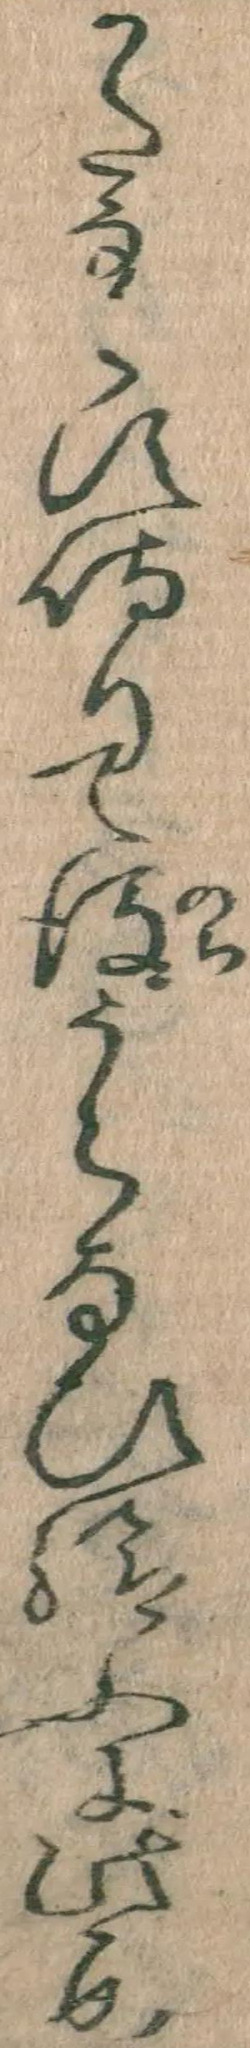かたならす侍りて後うらなひ給ふに。此かめ
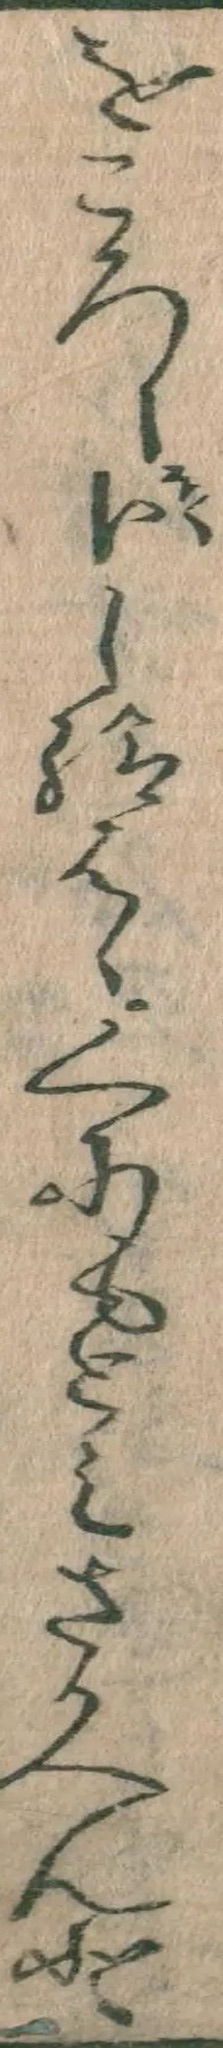をころし卜し給はゝ、くにもとみさかへんと
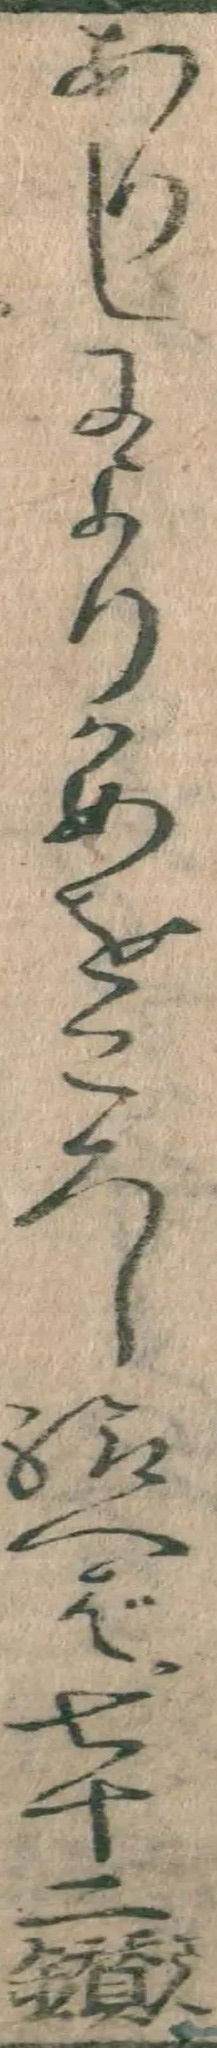ありしによりかめをころし給へば。七十二鑚
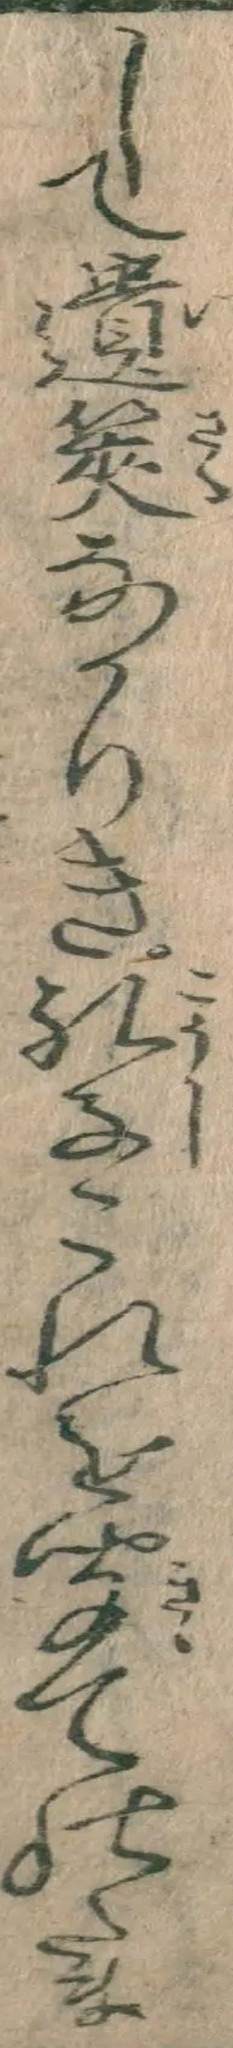して遺筴なかりき。孔子これを聞てのたま
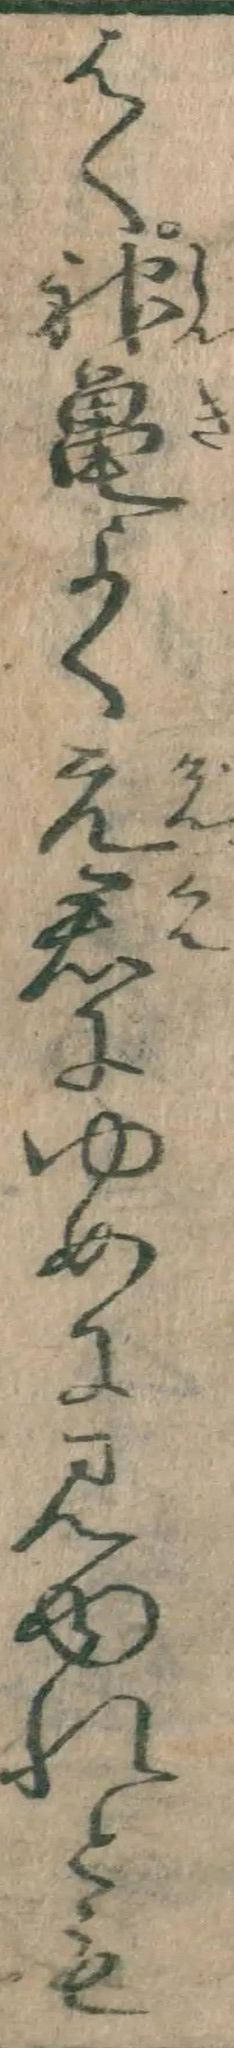はく。神亀よく元君にゆめに見ゆれとも

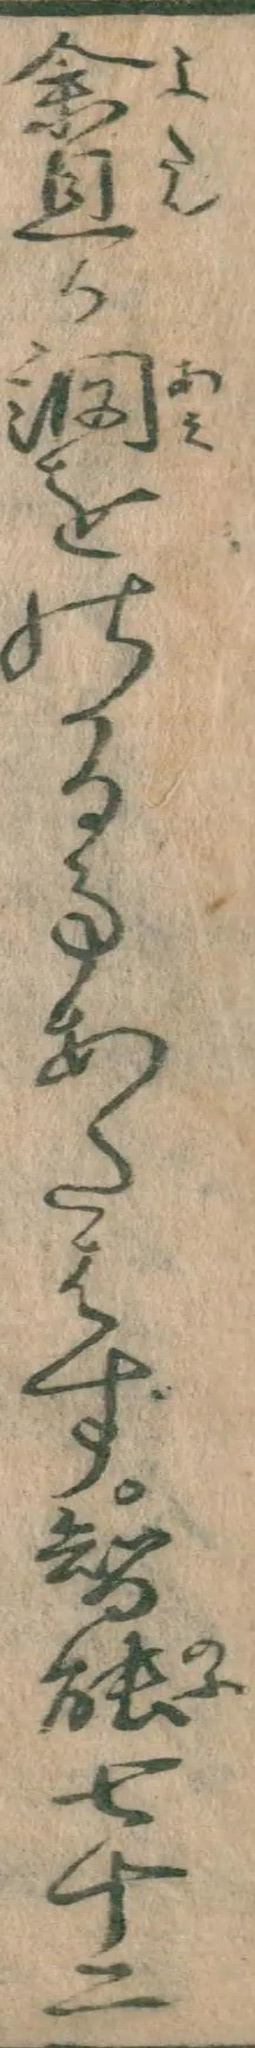余旦か網をのかる事あたはず。智能七十二
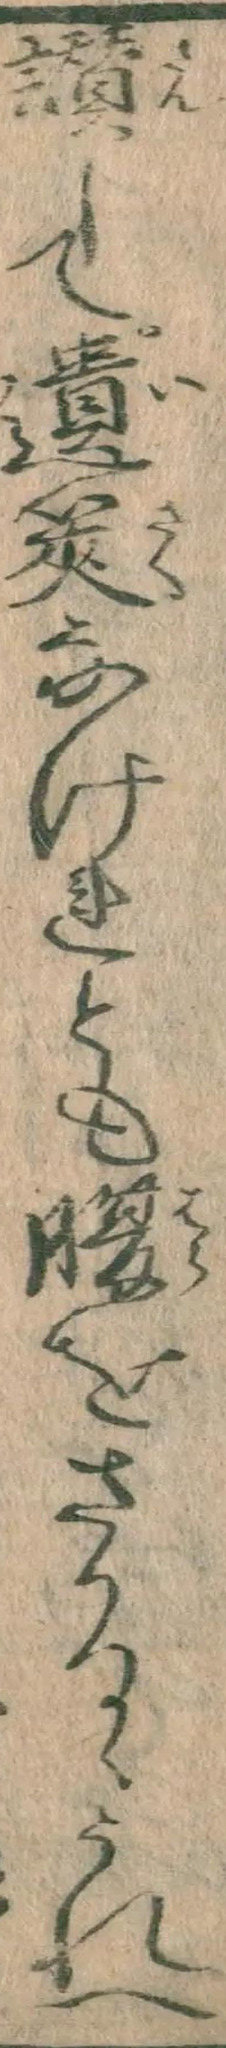讃して。遺筴なけれとも腹をさかるゝうれへ
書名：竹斎狂歌物語 3巻
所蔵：国立国会図書館 National Diet Library, JAPAN
